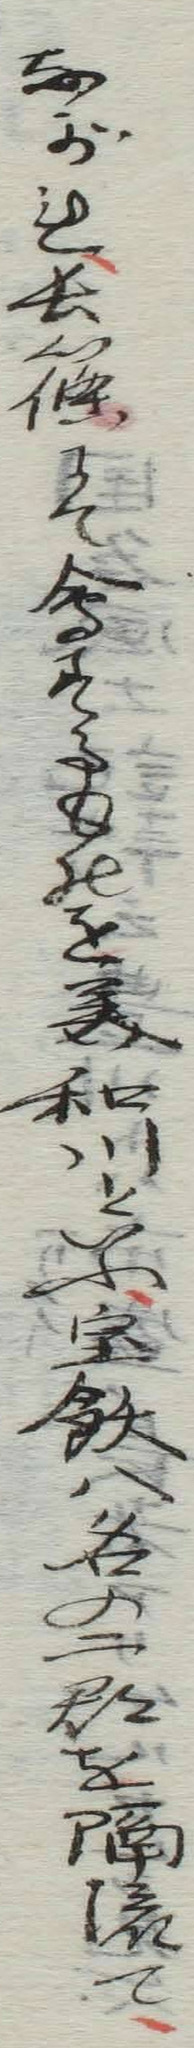ながれ、長篠にて会するものを美和川といふ、宝飫八名の二郡を隔流て、
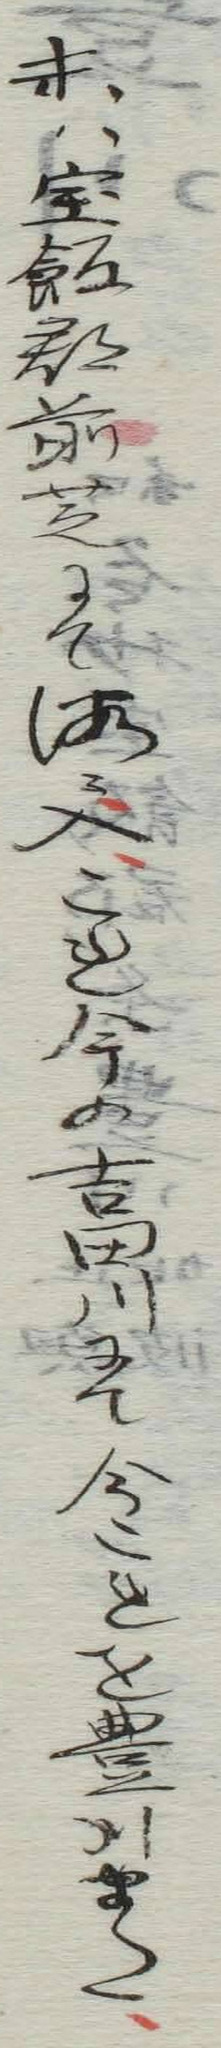末は宝飯郡前芝にて海に、入、これ今の吉田川にて今これを豊川また、
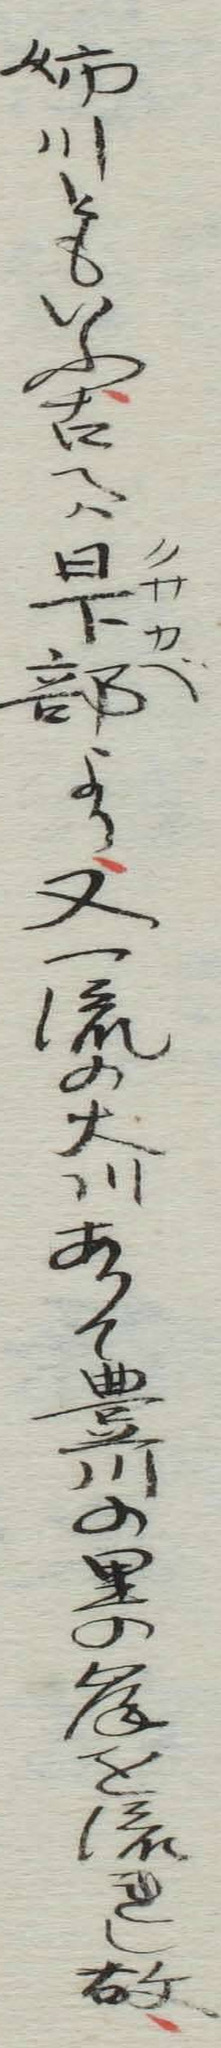姉川ともいふ、古へは日下部より、又一流の大川ありて豊川の里の岸を流れし故、
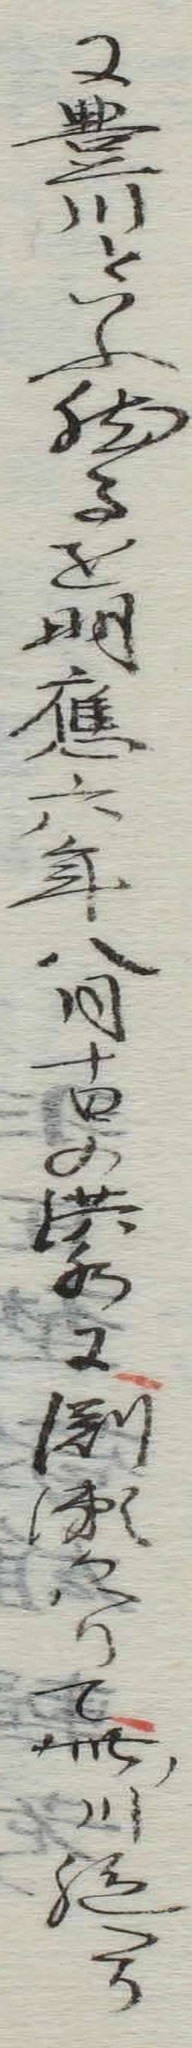又豊川といふ然るを明応六年八月十日の洪水に、渕瀬かはりて、此川絶たり
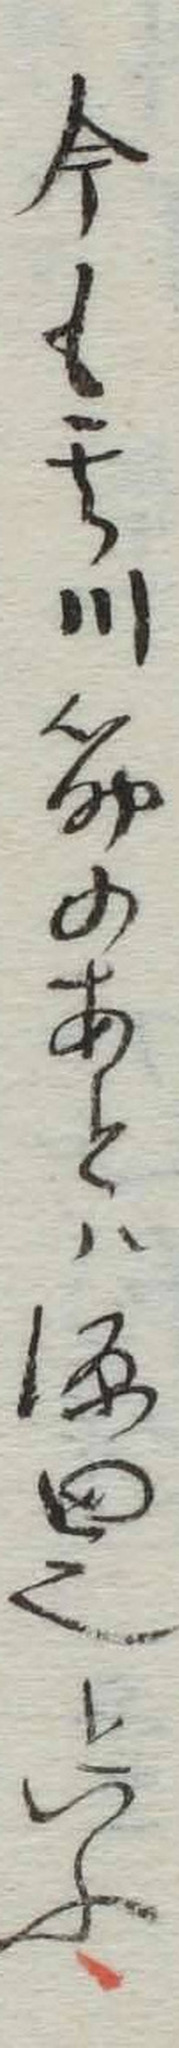今も其川筋のあとは深田也といふ、
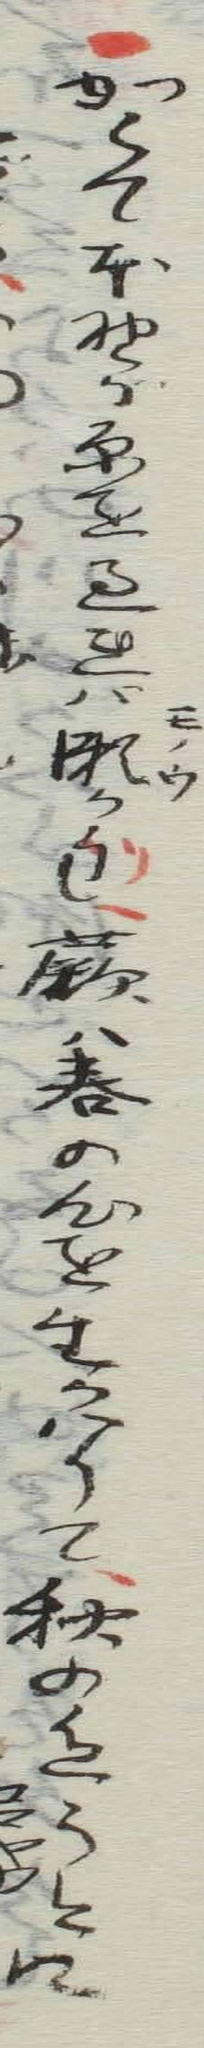●かくて本野か原を過れば懶かりし、蕨は春の心を生かはりて、秋の色うとけ
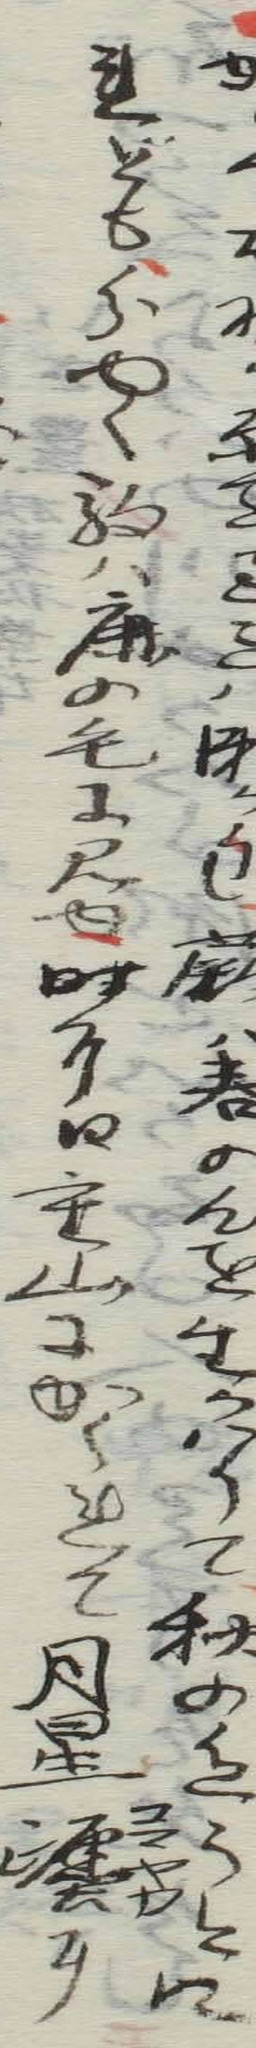れども、分ゆく駒は鹿の毛に見ゆ、時に日重山にかくれて月星躔に
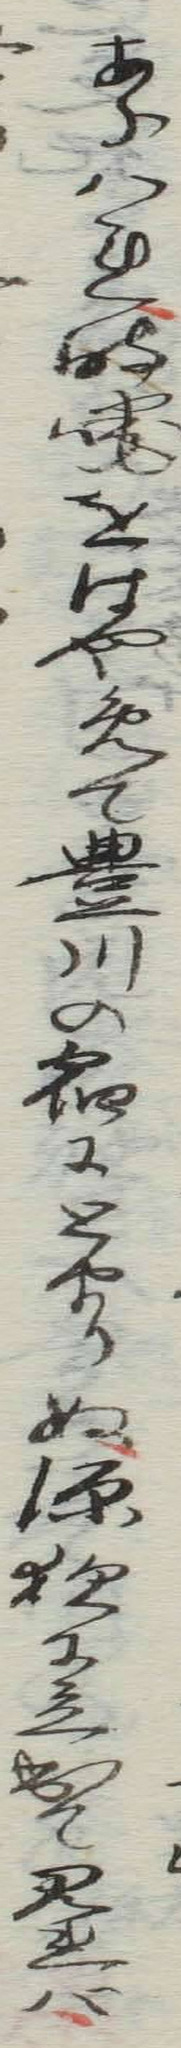あらはれ、時暁をはやめて豊川の宿にとまりぬ、深夜に立出て見れば、
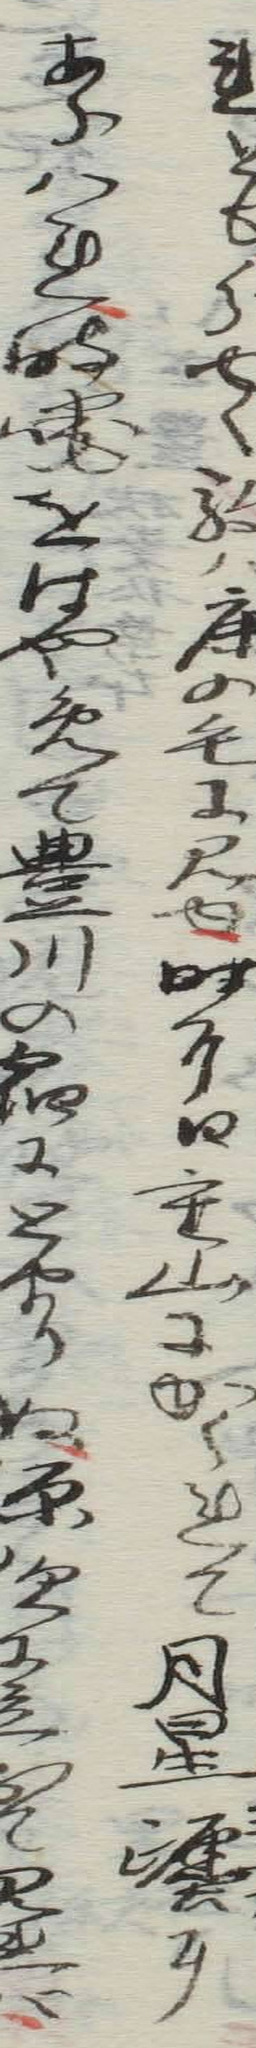あらはれ、時暁をはやめて豊川の宿にとまりぬ、深夜に立出て見れば、
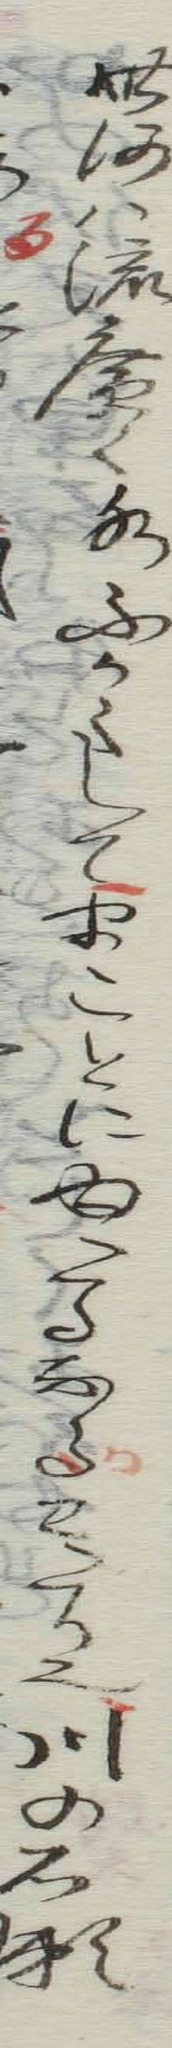此河は流広く水ふかくして、まことにゆたかなるわたり也、川の石瀬
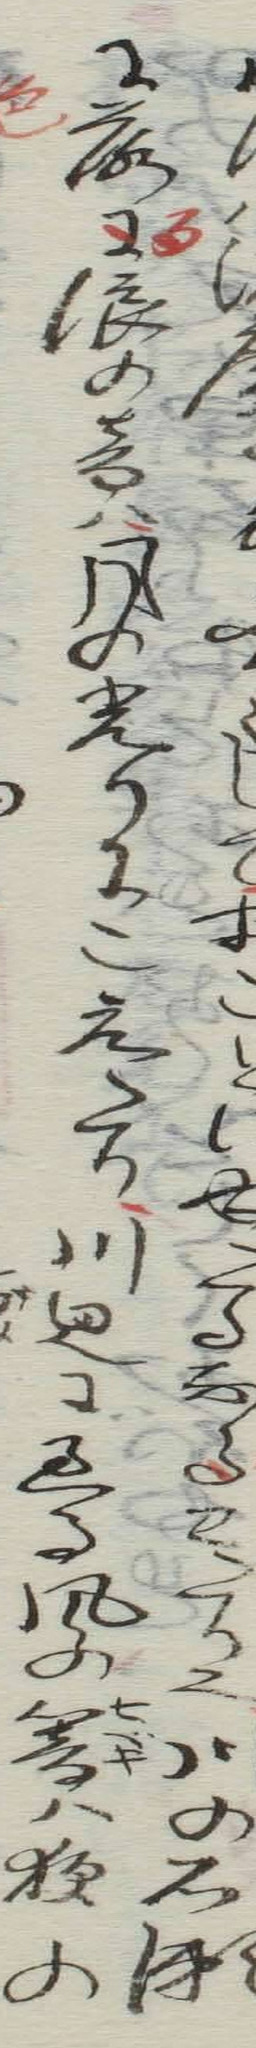に落る浪の音は、月の光りにこえたり、川辺に過る風の響は夜の
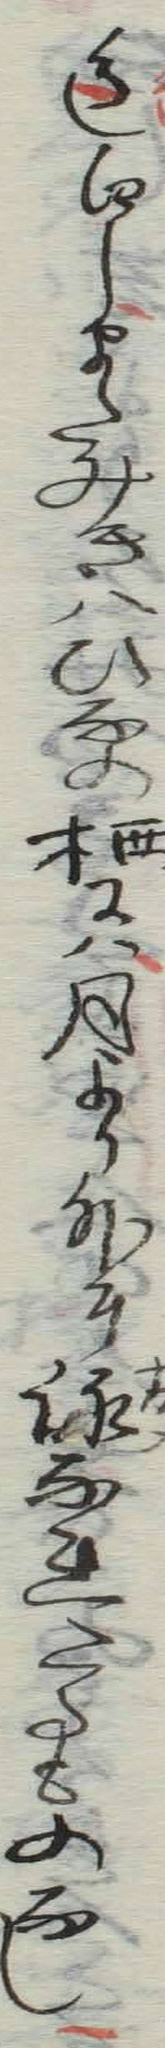色白しまたみきはひなの栖には、月より外に詠なれたるものなし、
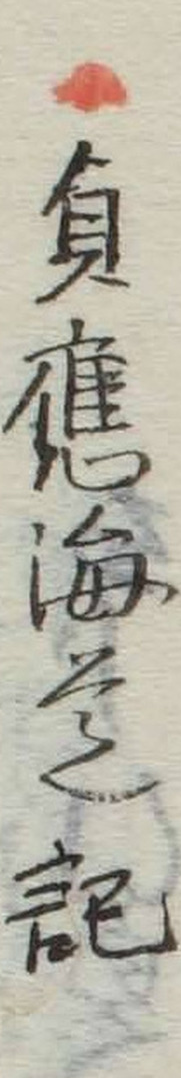●貞応海道記
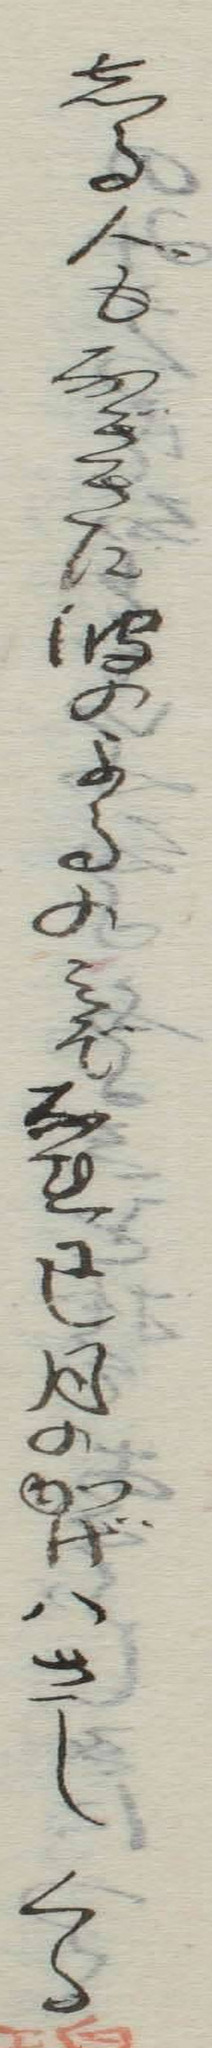しる人もなぎさに波のよるのみぞなれにし月のかげはさしくる白モ
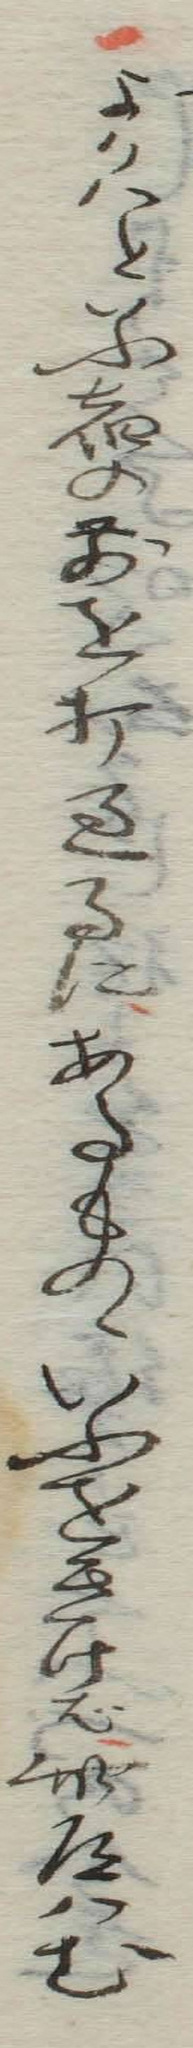●よかはといふ宿の前を打過るに、あるものゝいふをきけば、此道はむ

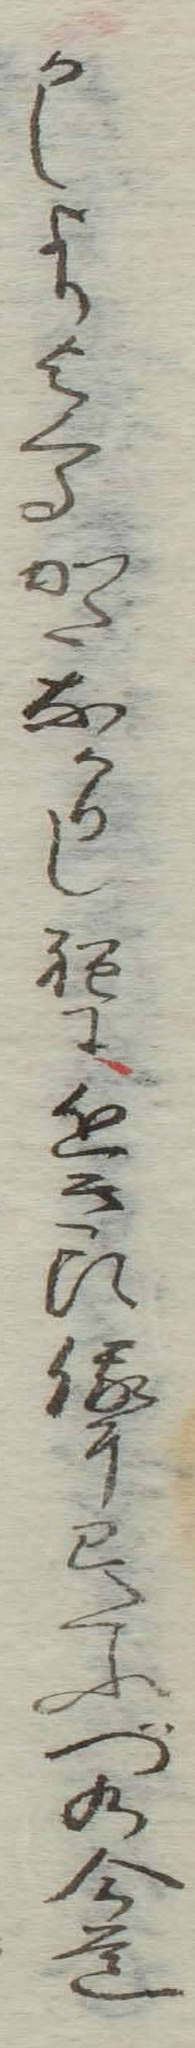かしよりよくるかたなかりし程に、近き頃俄にわたふづの今道
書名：三河国古跡考
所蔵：国文学研究資料館
